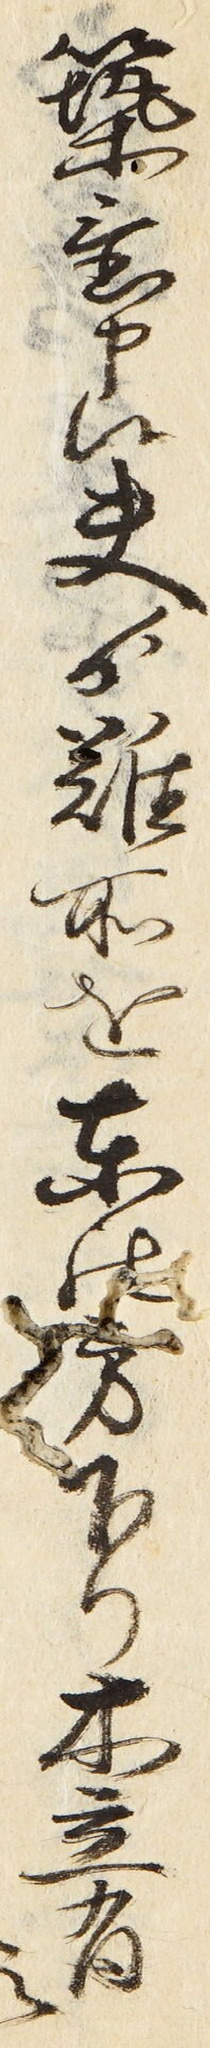築置申候夫ゟ難所を東の方下り木立有之
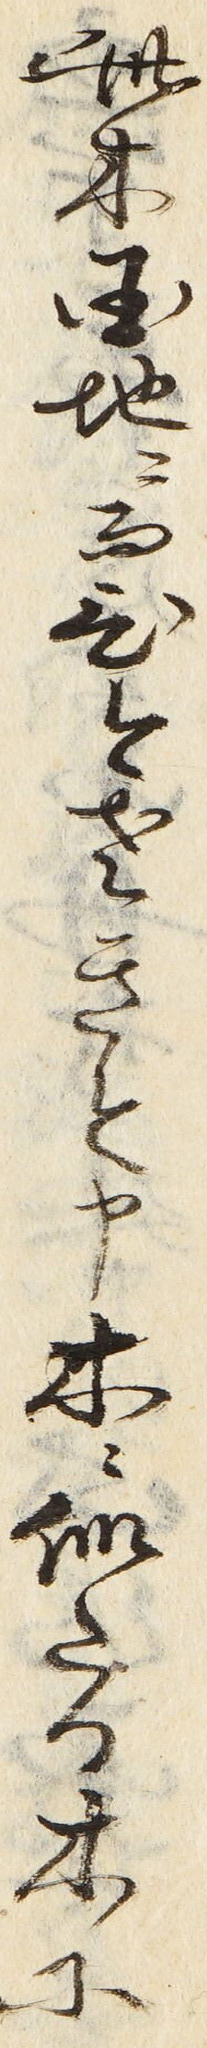此木国地ニ而ひとさきと申木ニ似たる木に
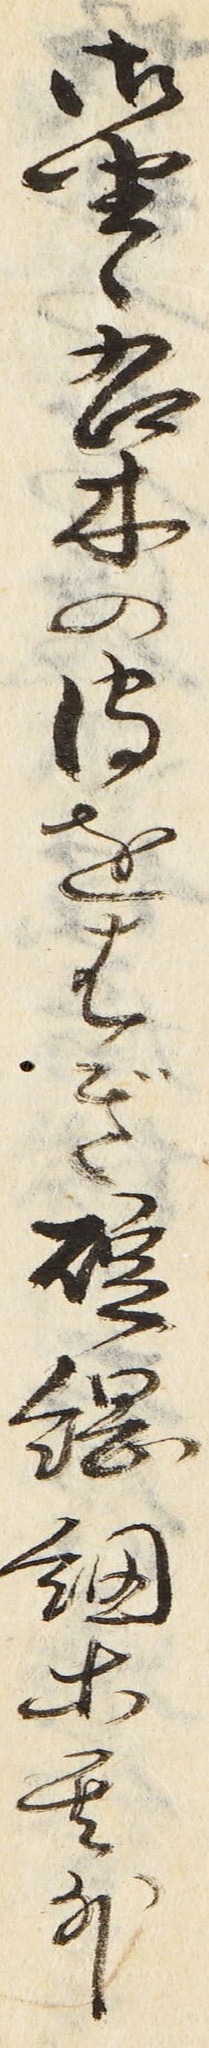御座候右木の皮をはぎ碇綱網等其外
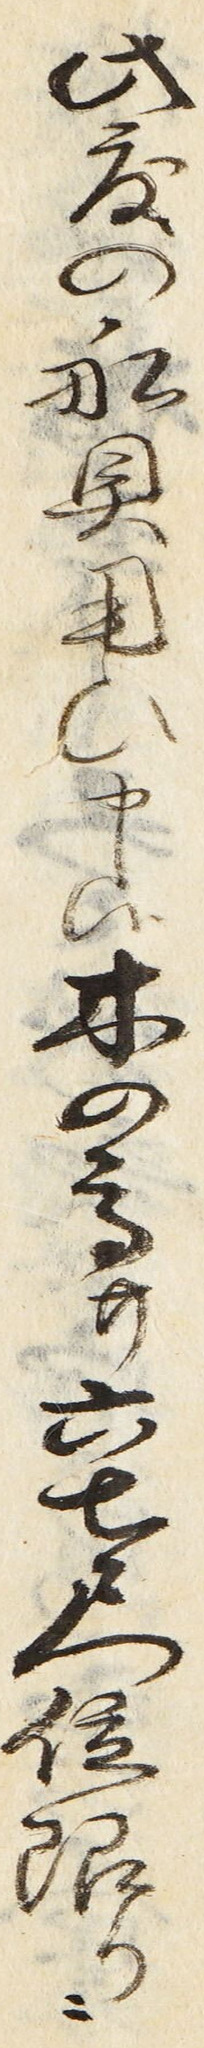此度の船具用ひ申候木の高サ六七尺位限りニ
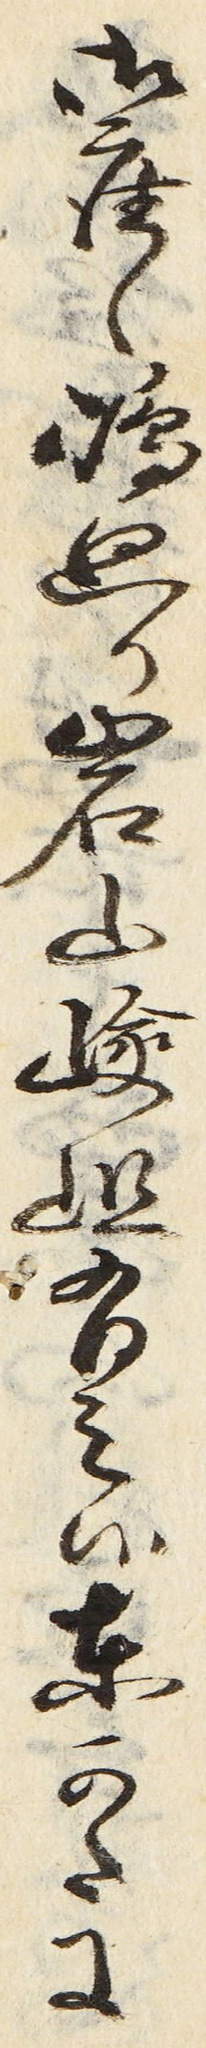御座候嶋廻り岩山嶮岨有之候東かたに
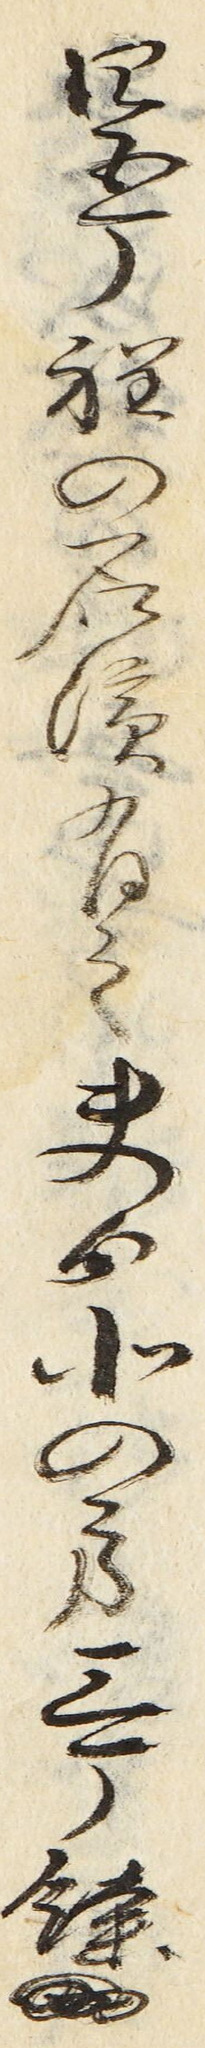四五丁程の石浜有之夫ゟ北の方三丁余
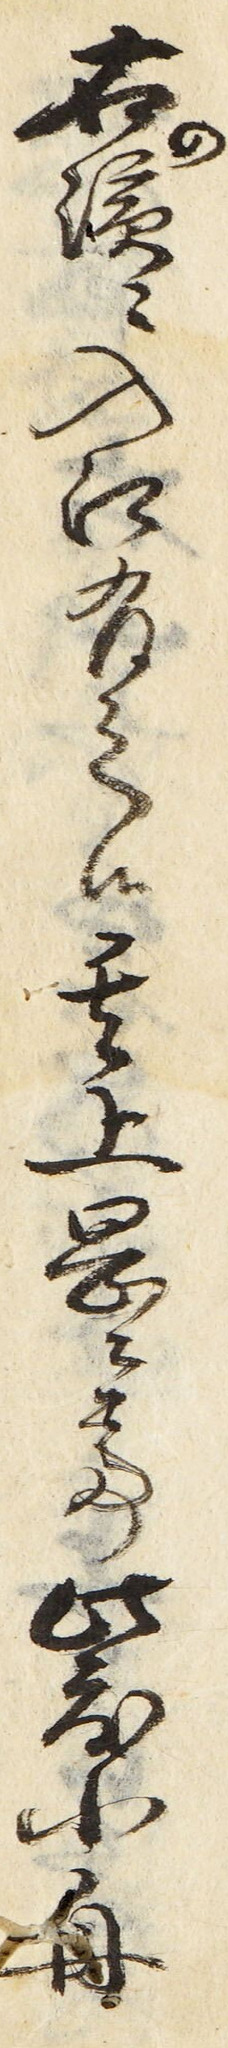右の浜ニ入江有之候其上岡ニて此度小舟
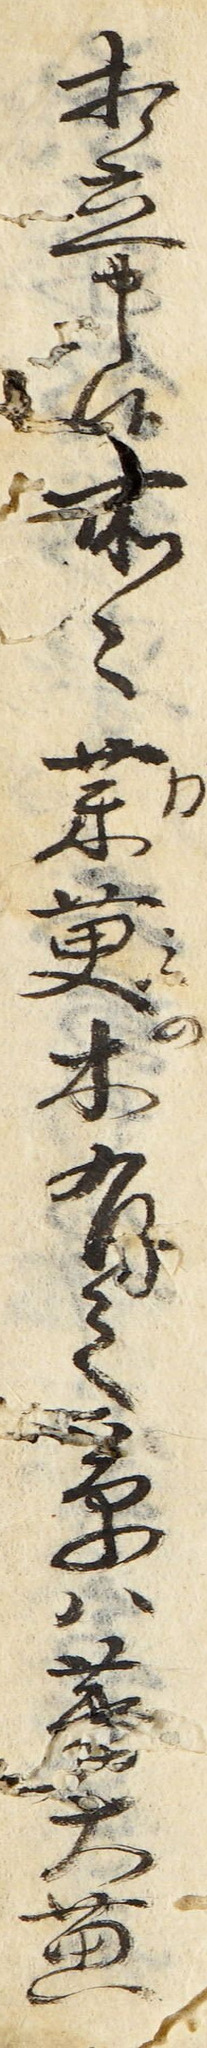打立申候所々茱萸の木有之草大

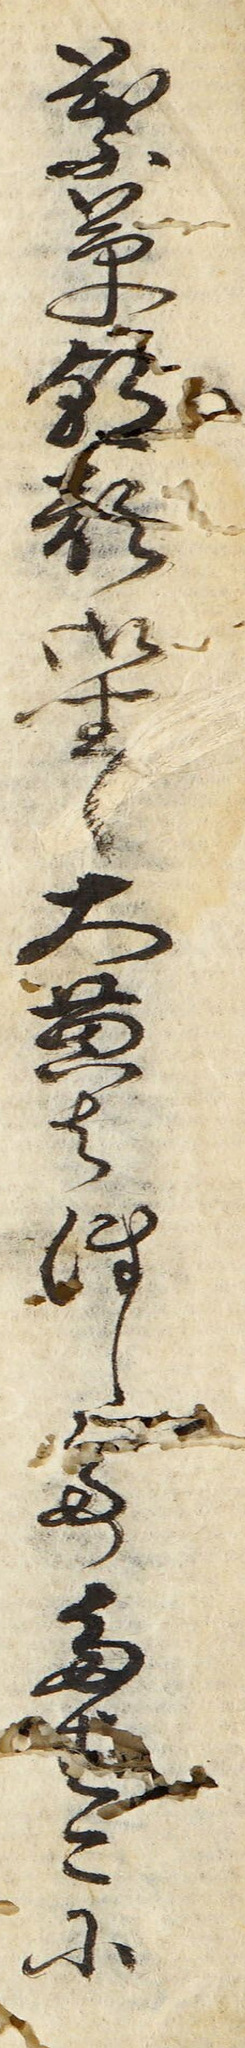葉草朝顔御座候大葱者ほしてたはこに
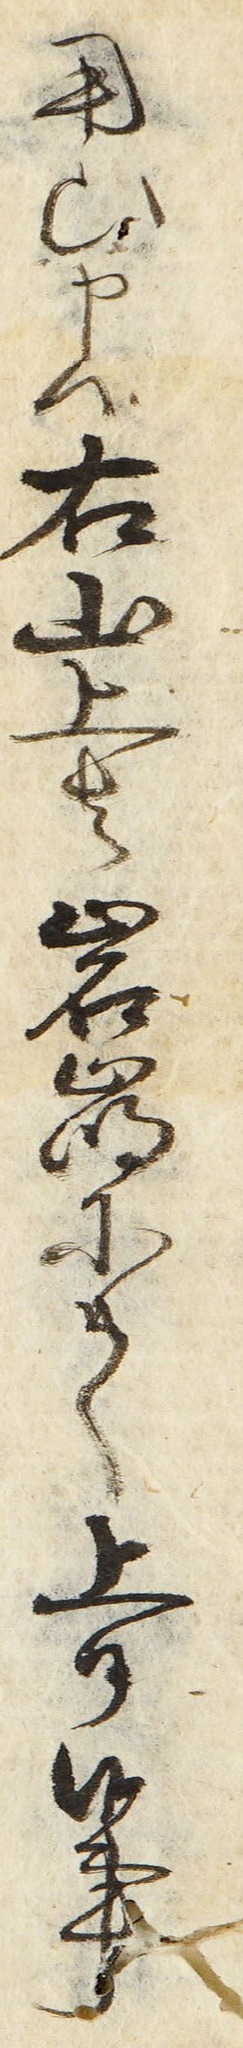用ひ申候右山上者岩崩にて上り候事
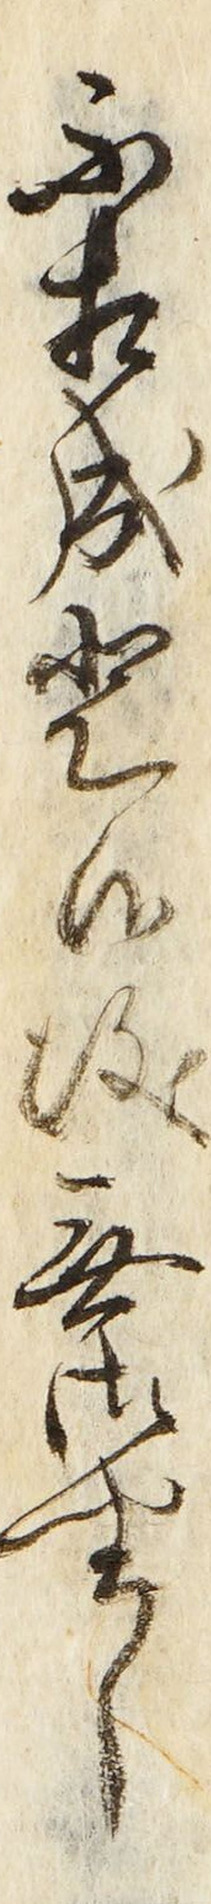不相成登候儀無御座候
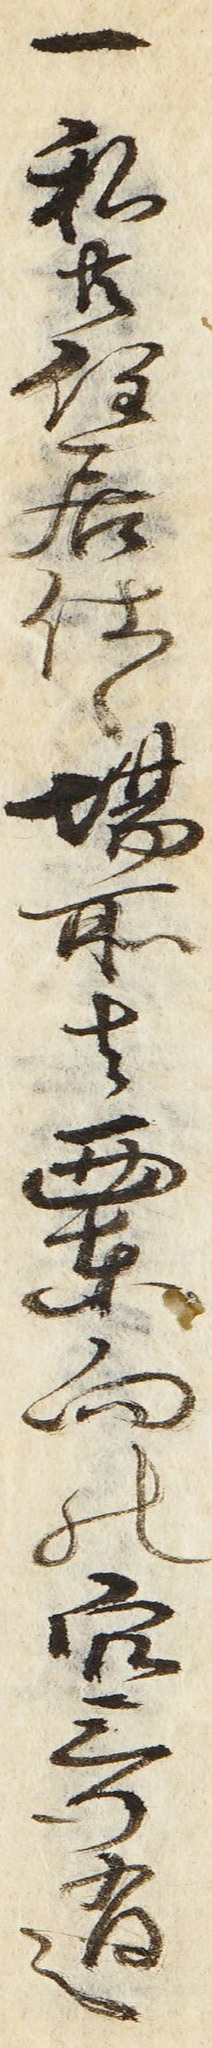一私共住居仕候場所者西東向の穴三ツ有之
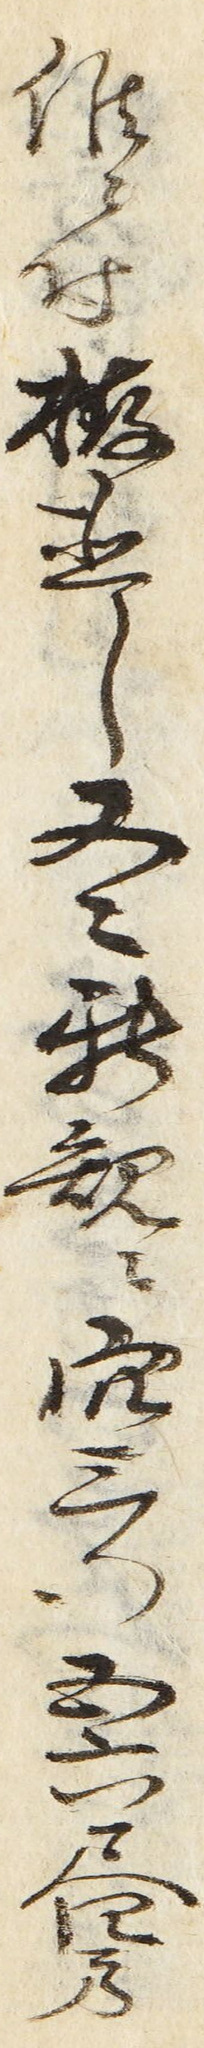候ニ付拵直し又々新規ニ穴三ツ五六尺四方
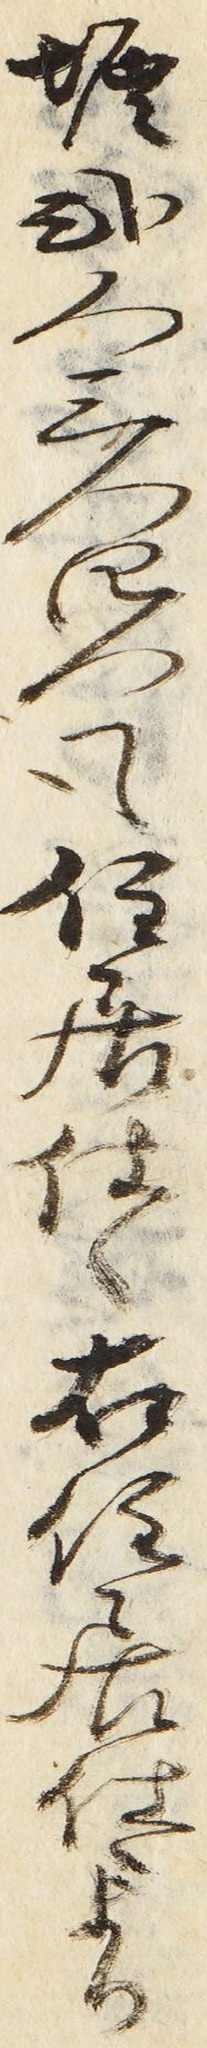堀弐人三人四人ツヽ住居仕候右住居仕候より
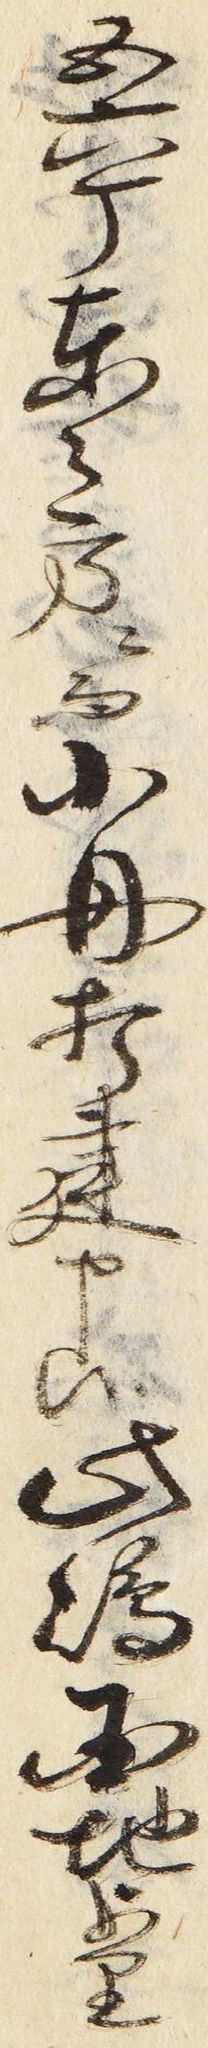五六丁東之方ニ而小舟打建申候此嶋国地より
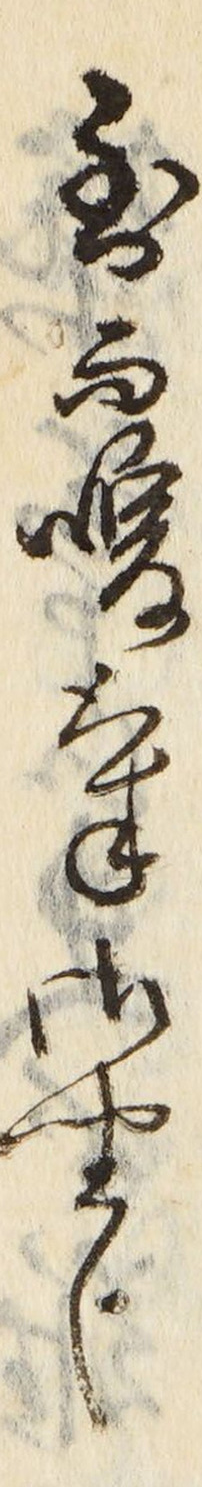至而暖気御座候
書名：漂流一件上書
